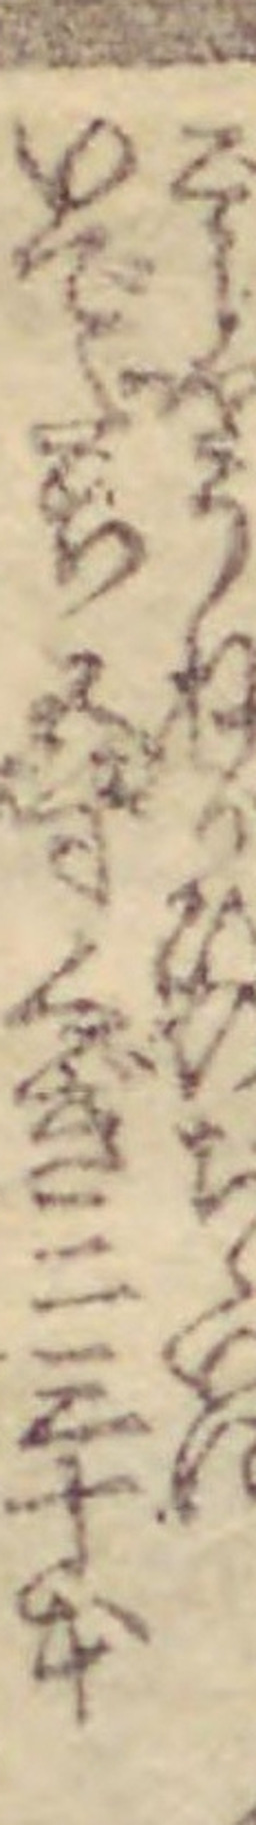いでたち五寸くぎ二三十本
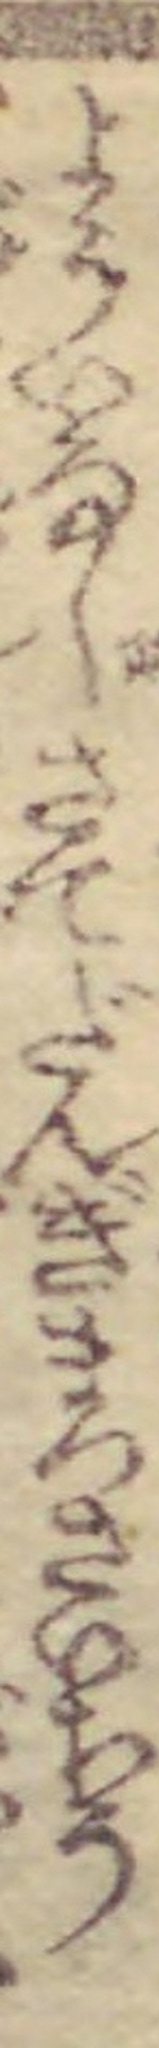よういなしさてだんぎまつさいちう
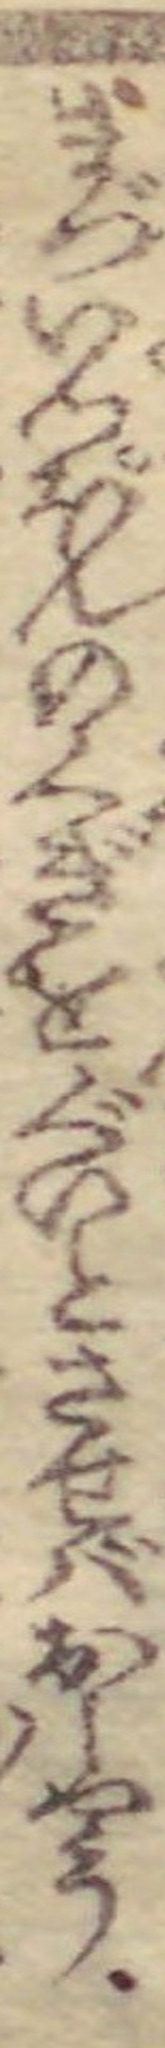まづいつぽんのくぎをぐいとさせばおしやう
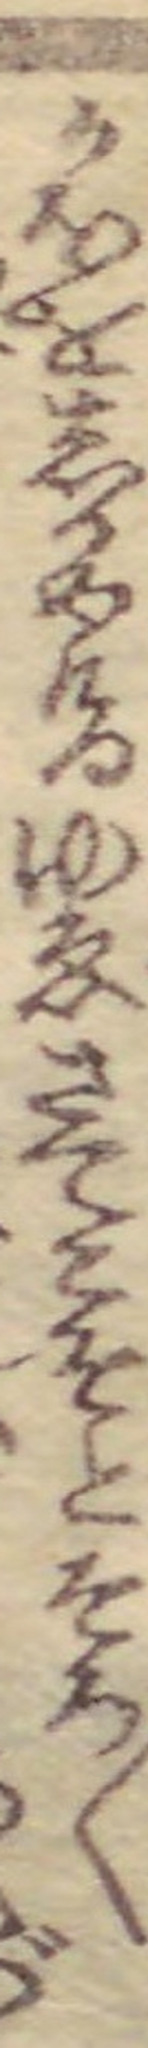かほをしかめけるゆゑさてこそとそろ〳〵
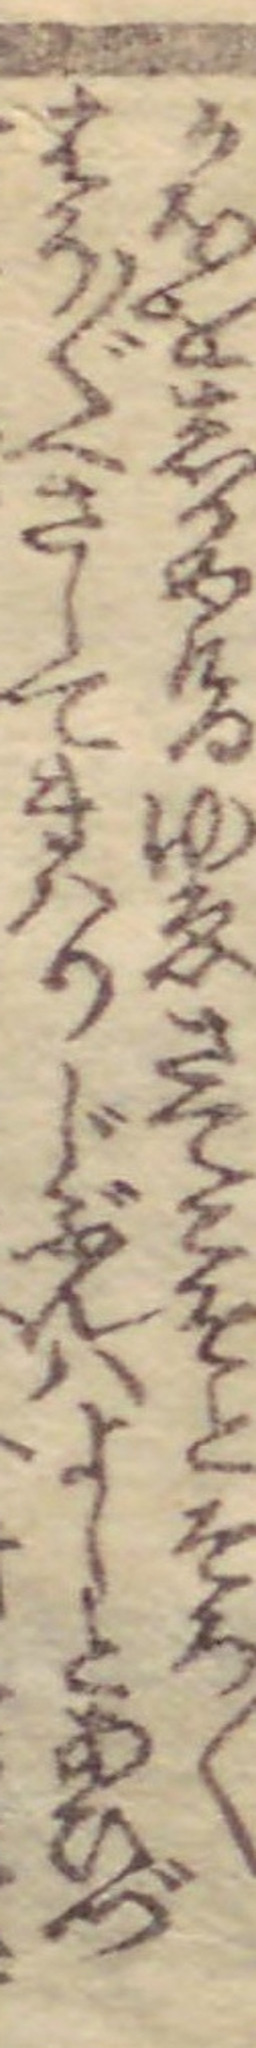はう〴〵へさしてまはりじぶんはよしとあひづ
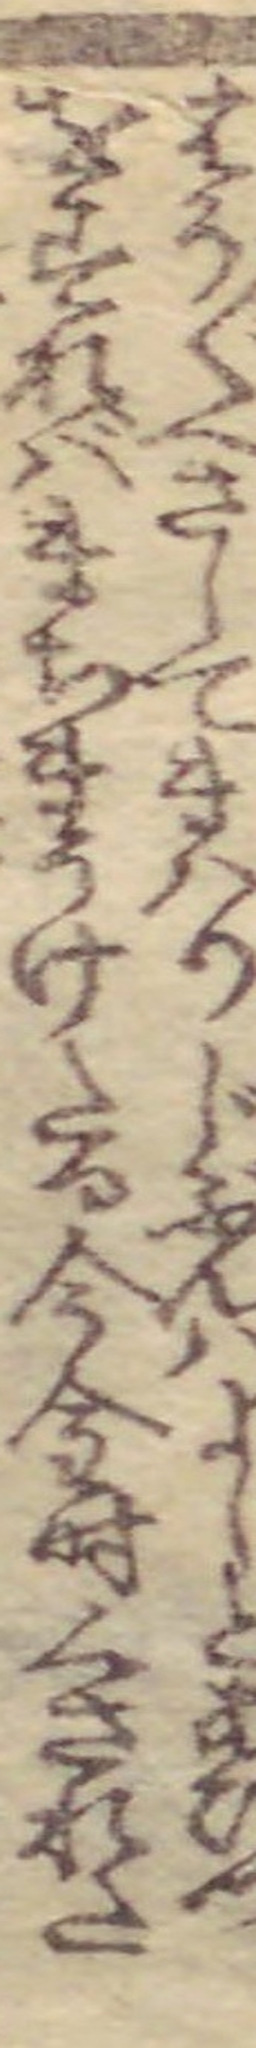をすればまちまうけたる今金時くされた
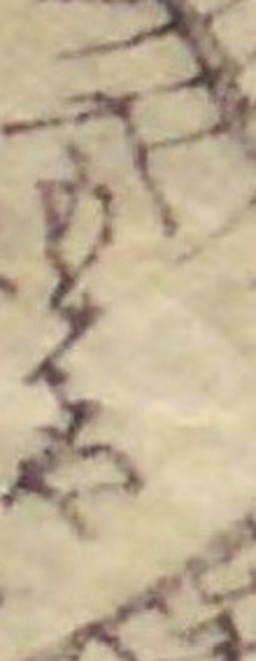〽もはや
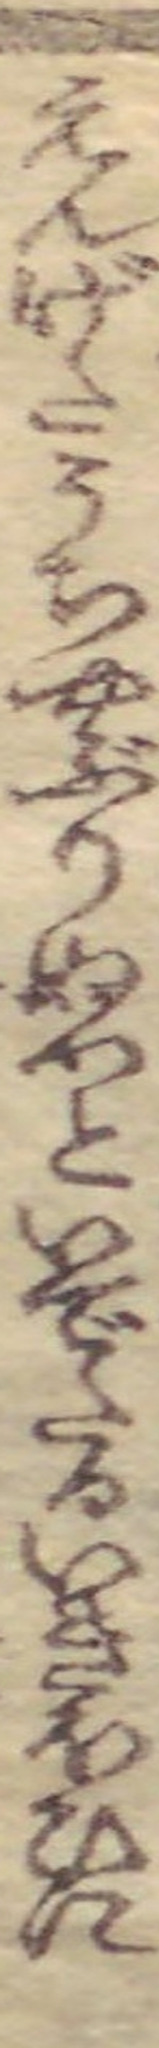えんげたうちやぶりぬつといでたるいきほひに
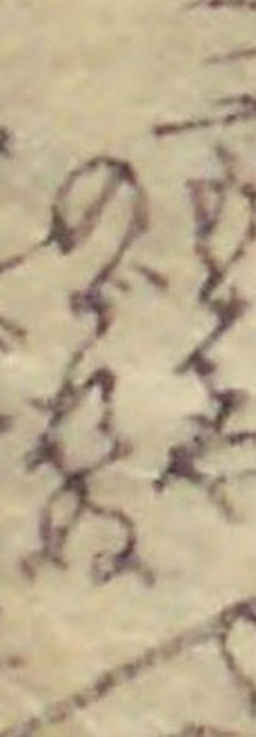のがれぬ
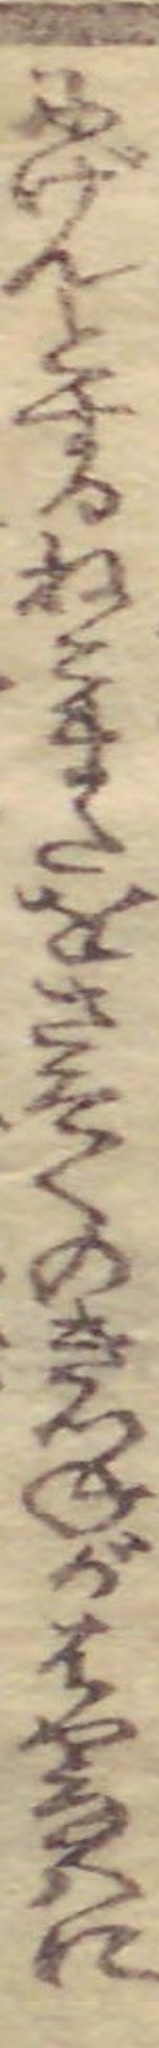にげんとするねこまたをさそくのきつねがはやなはに
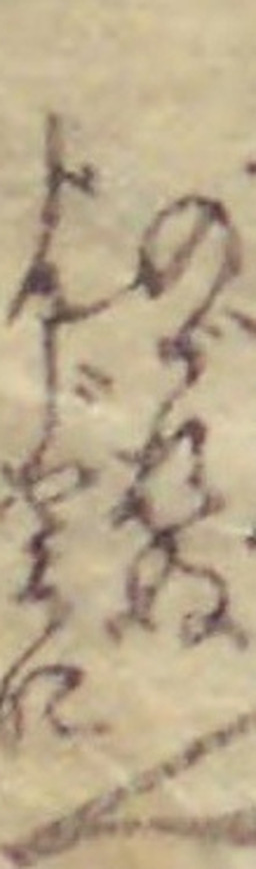んじやうに
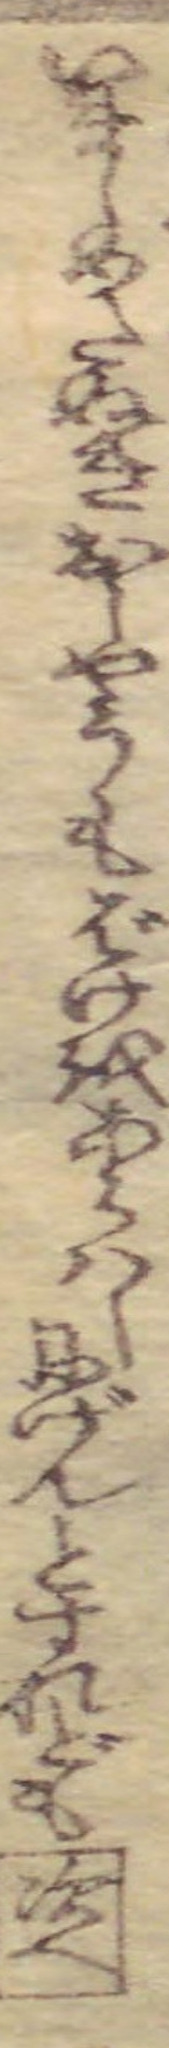いましめたぬきおしやうもばけをあらはしにげんとすれども次へ

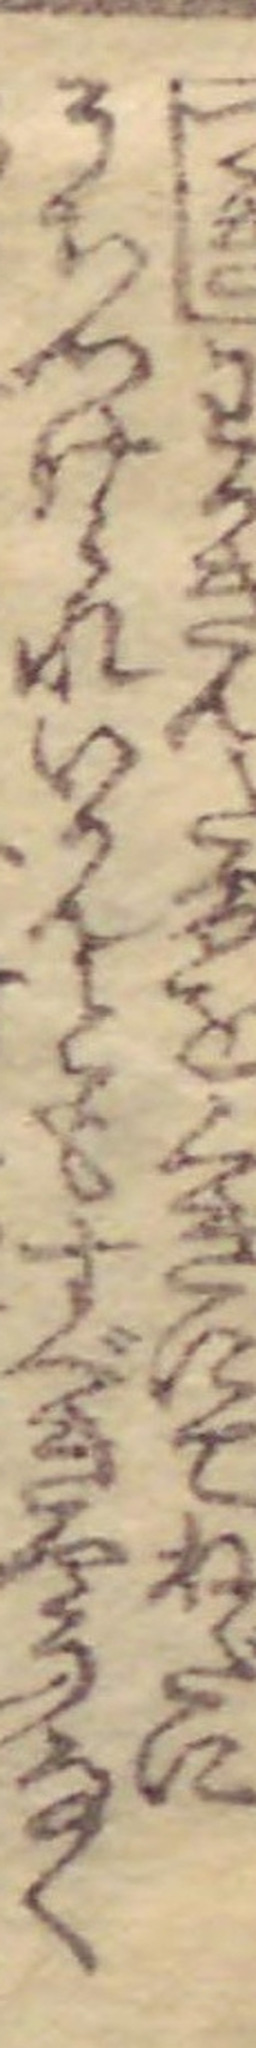うちつけられいかんともすべきやうなく
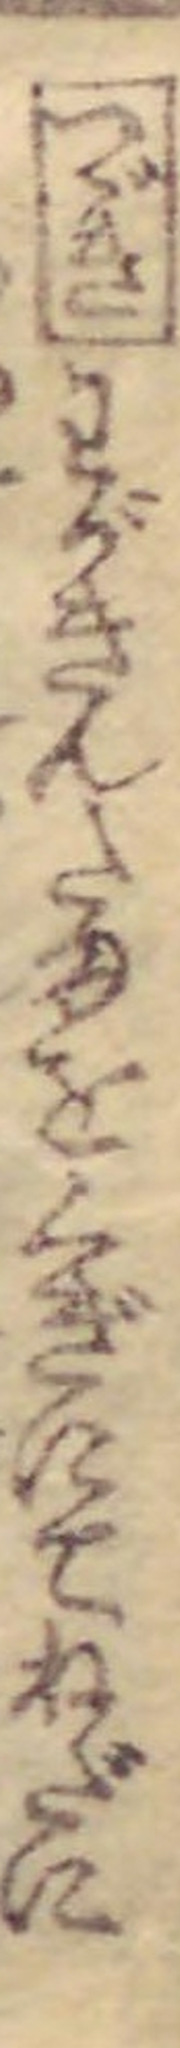つゞきわがきんたまをくぎにてねだに
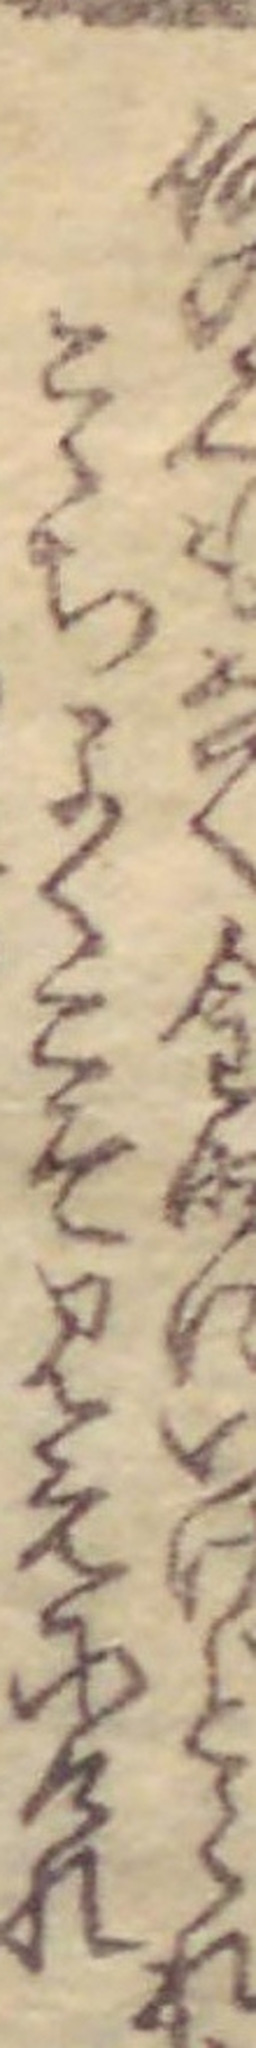こゝちよくこそみえにけれ
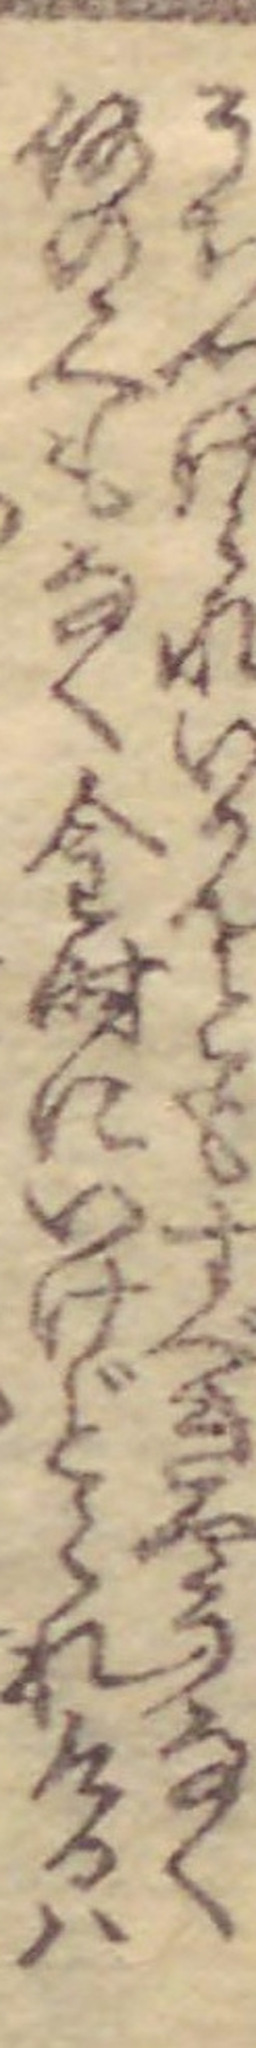何のくもなく金時にいけどられけるは
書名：化物世帯氣質
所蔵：国立国会図書館 National Diet Library, JAPAN
